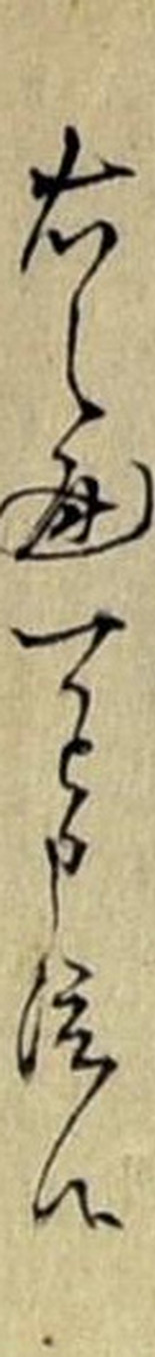右之通可被申渡候
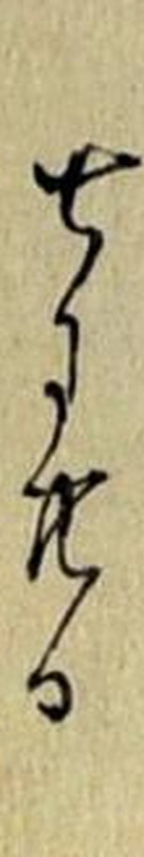七月廿日
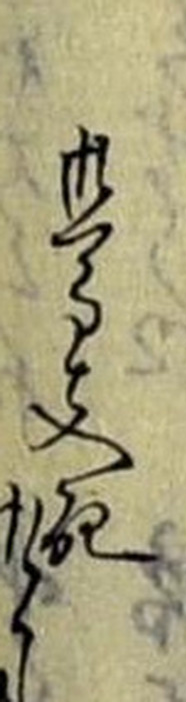御馬支配
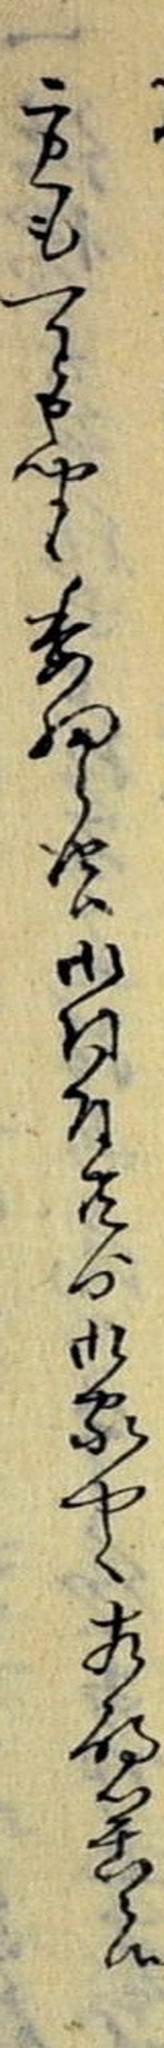方へも可被申聞候委細之儀は御目付共ゟ御家中へ相触筈に候
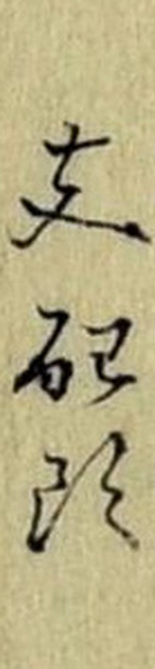支配頭
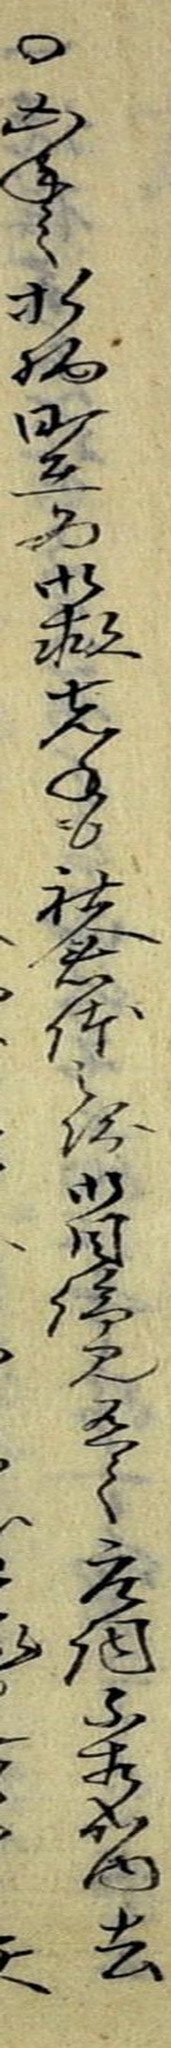○凶年之折柄町在為御救先年も社倉体之儀御目論見有之取調不相成内去
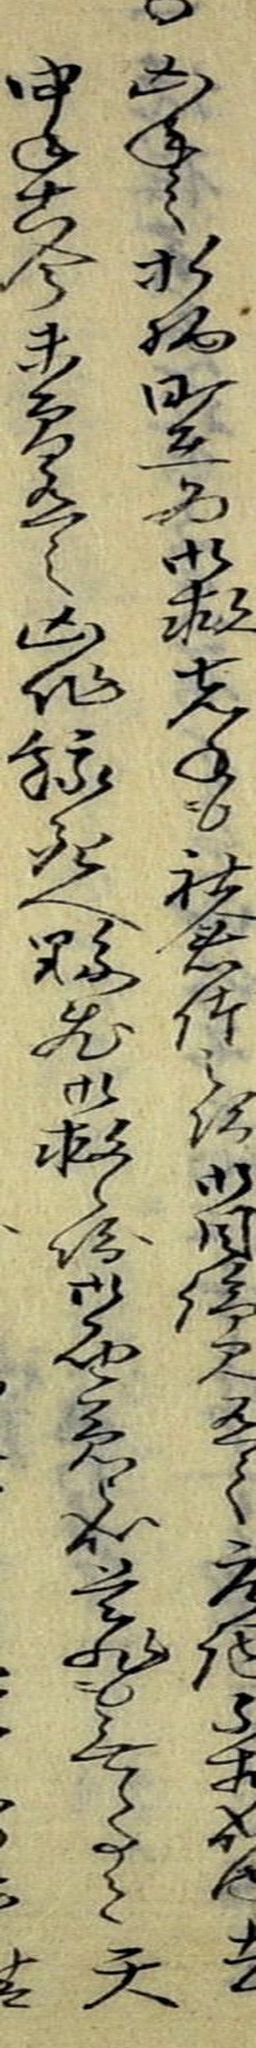申年古今未曾有之凶作餓死人夥敷御救之儀御届兼被成是非も無之事と天
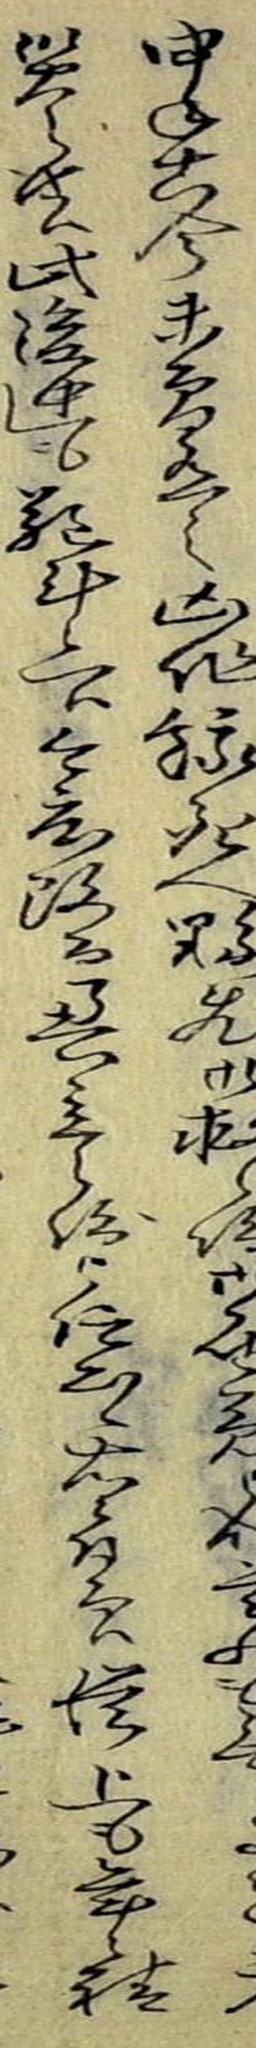災之儀は此後迚も難斗候へは今度改而奥立之儀被仰出候右に付而は従上年々精
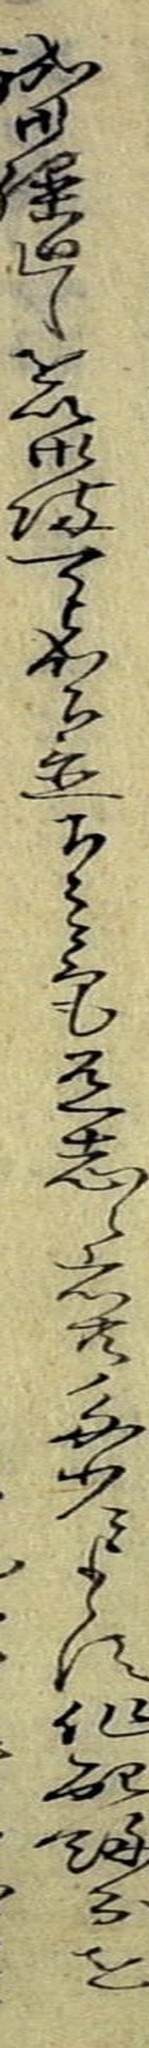誠御繰廻しを以御備可被成下置下々に而も有志之者共多少によらす作配余分を
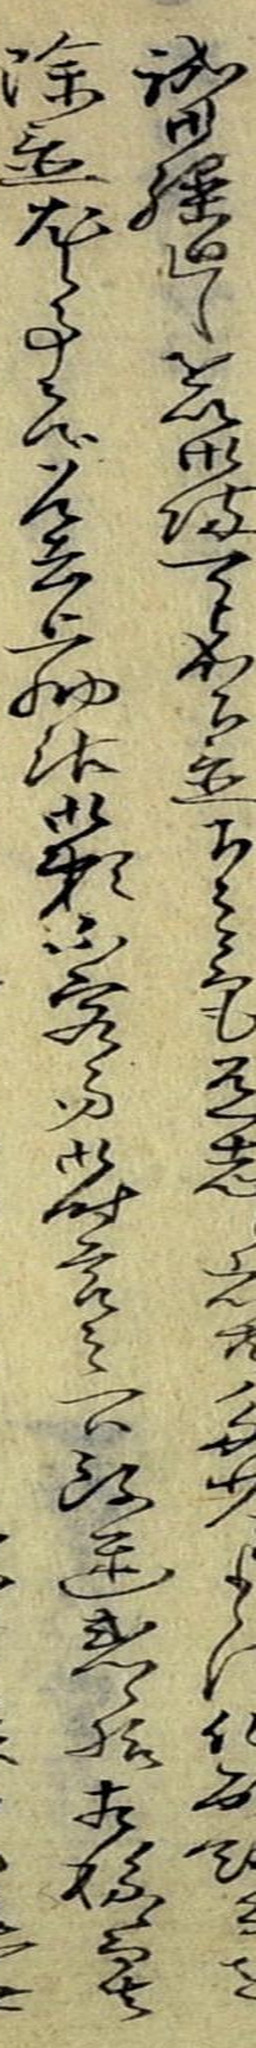除置尤之事に候乍去上納銀御頼不容易御時節に候へは致迷惑候様相移候而は
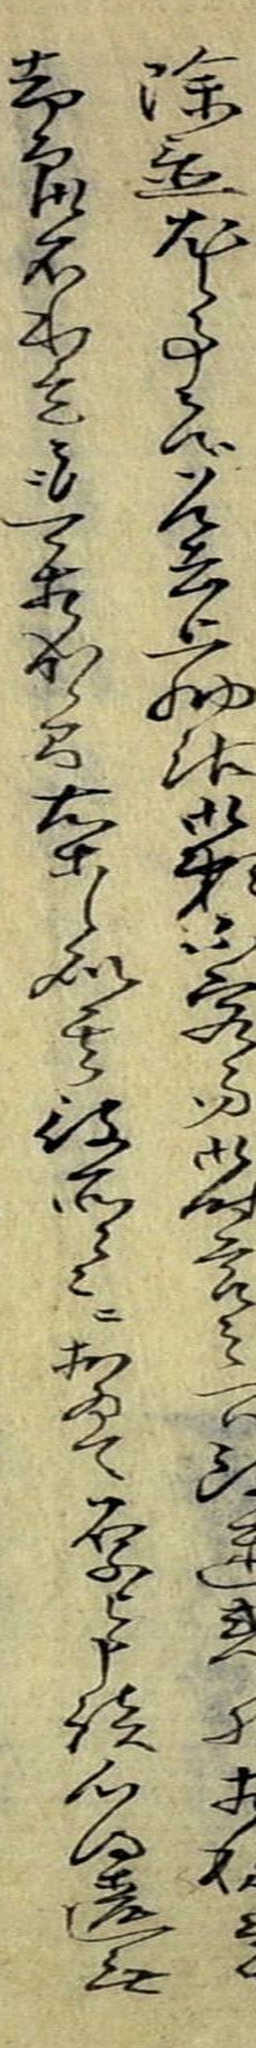却而御不本意にも可相成候間右等之処其役所々々におゐて厚被申談心得違無
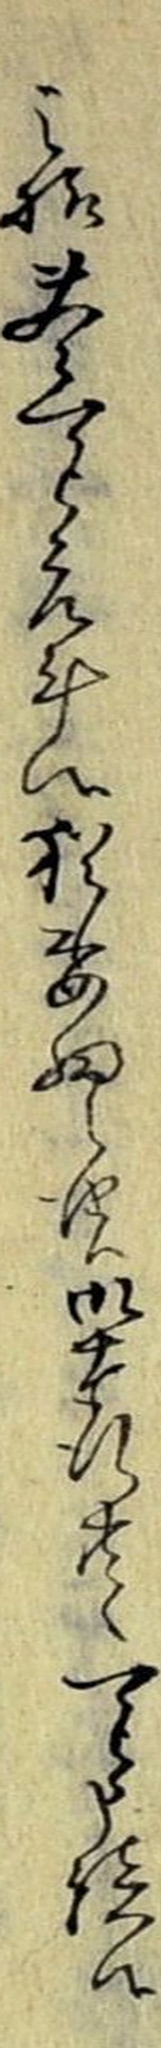之様夫々可被取斗猶委細之儀は御奉行共へ可被申談候
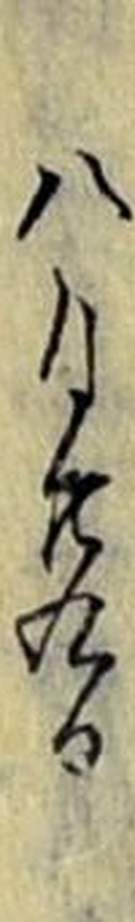八月廿九日
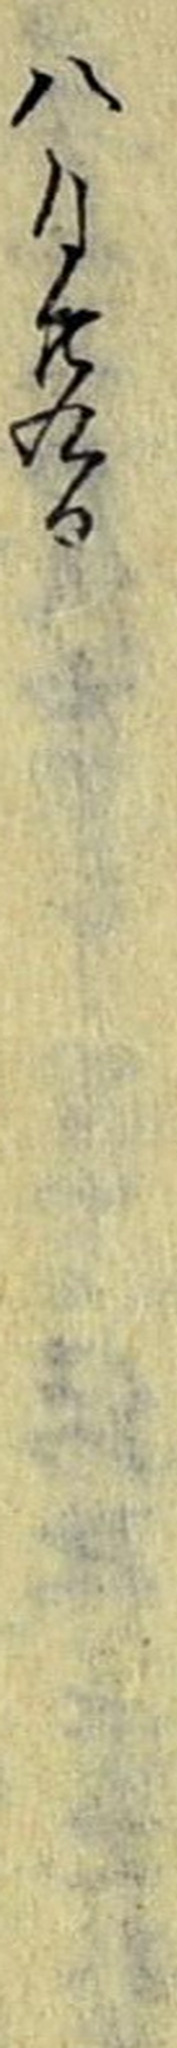八月廿九日
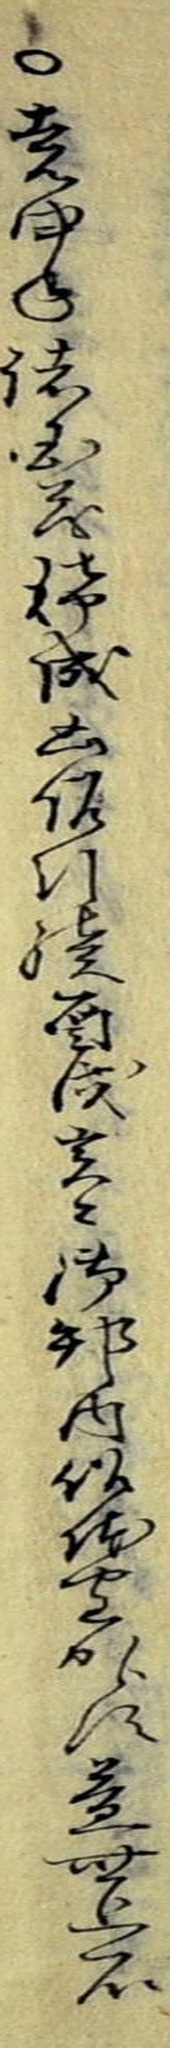○去申年諸国も稀成凶作引続酉戌亥と御邦内作体宜からす益此上不

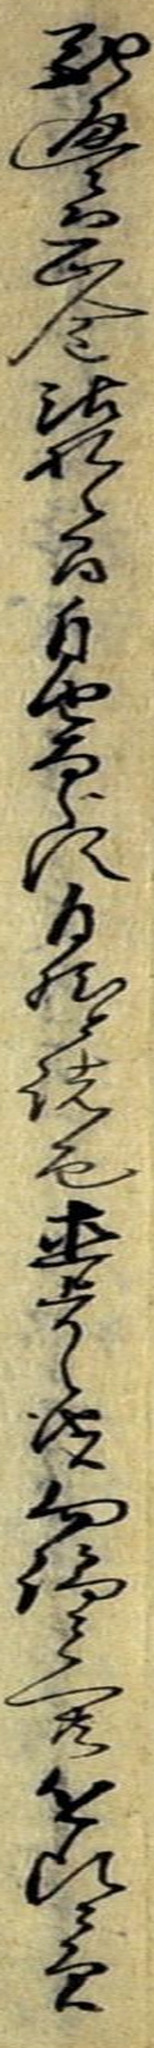融通に而正金銀札之間自由ならす自然諸色直上り候儀は勿論に候へ共近頃に而は
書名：命令之部 六
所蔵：福井県文書館 Fukui Prefectural Archives
